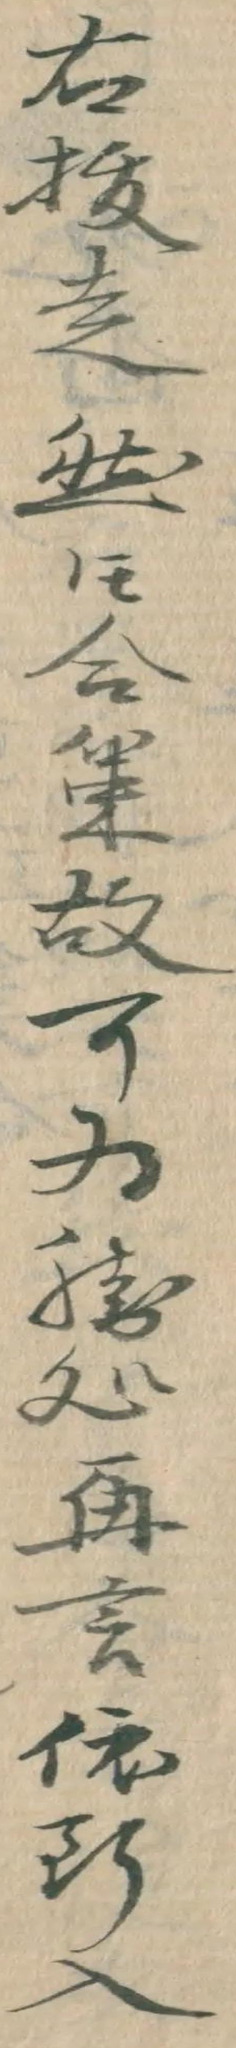右抜走然トモ合策故可為勝処再言依断入
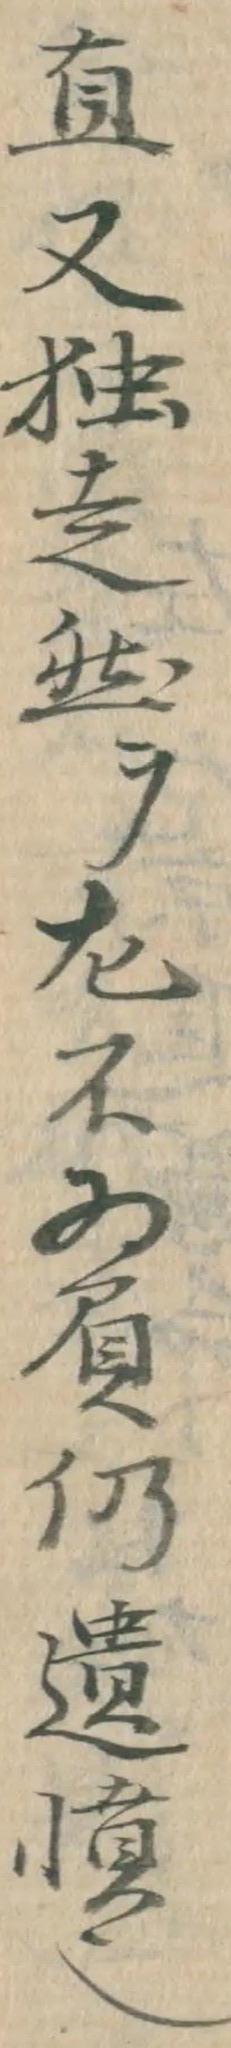直又独走然ヲ左不為負仍遺憤也

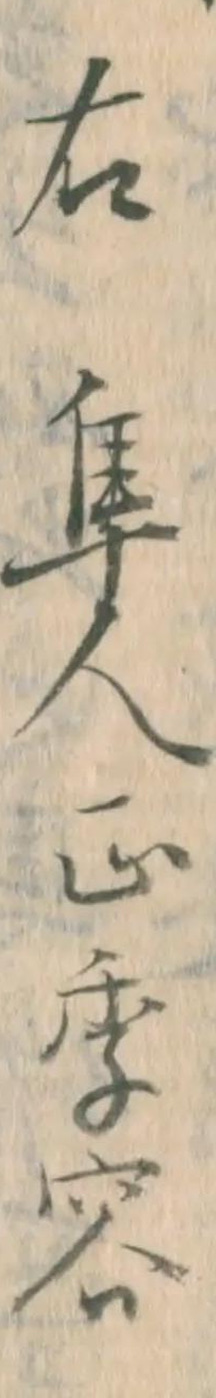右隼人正季容
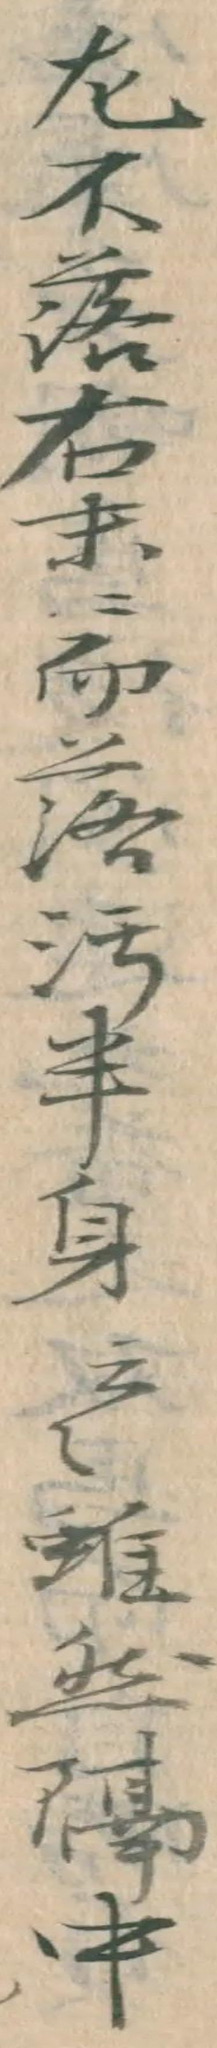左不落右末ニ而落汚半身云々雖然隔中
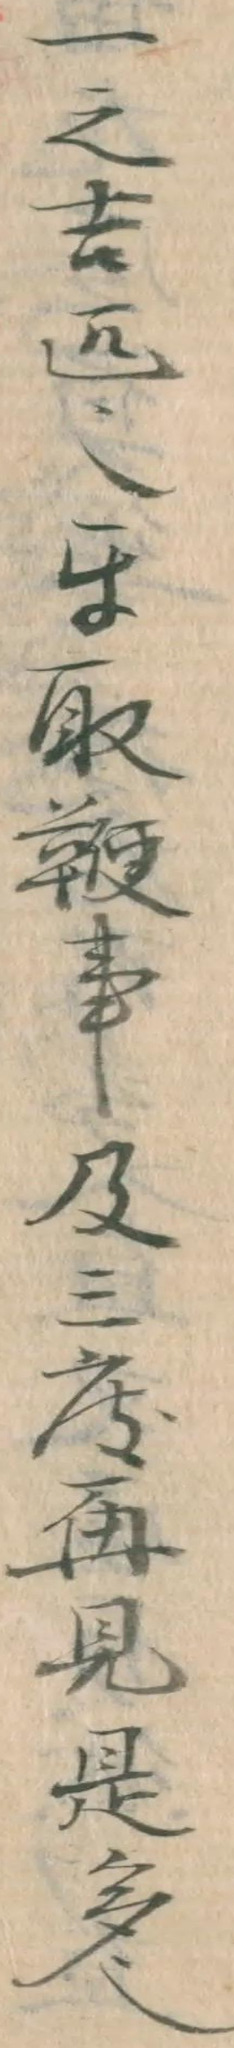一之吉匹也互取鞭事及三度再見是多也
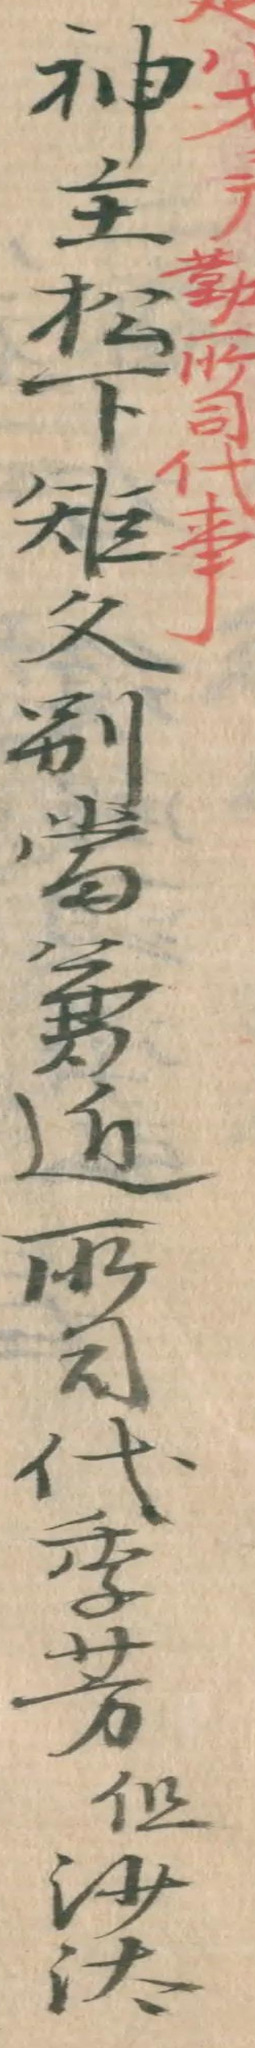神主松下矩久別当兼近所司代季芳但沙汰
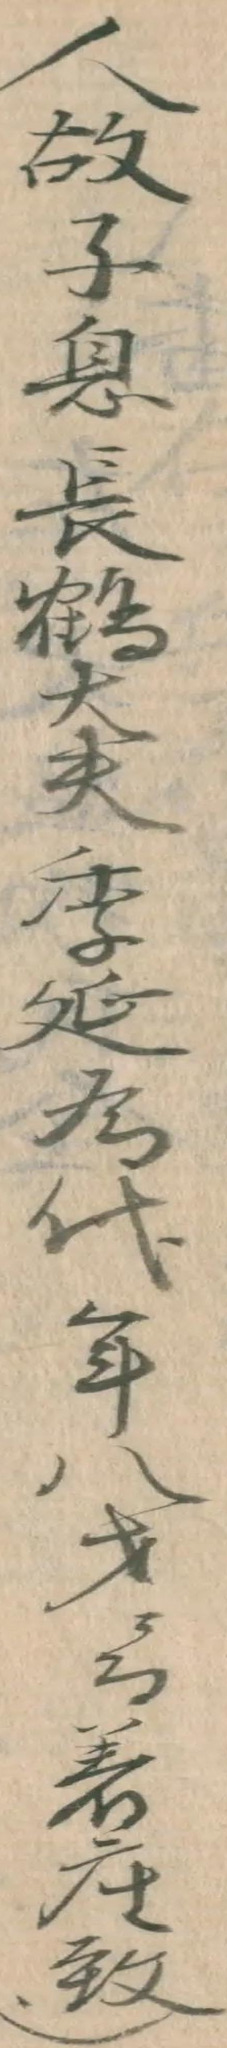人故子息長鶴大夫季延為代年八才ニ而着座致也
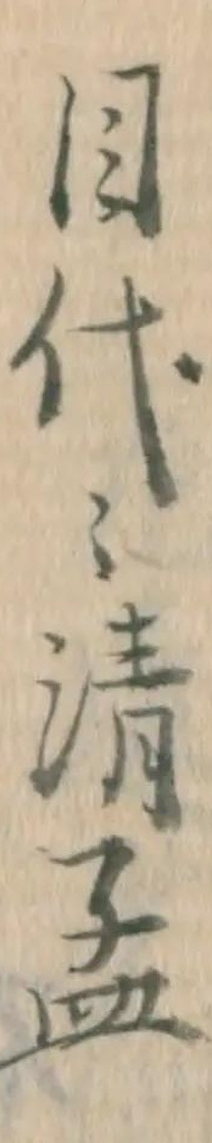目代々清孟
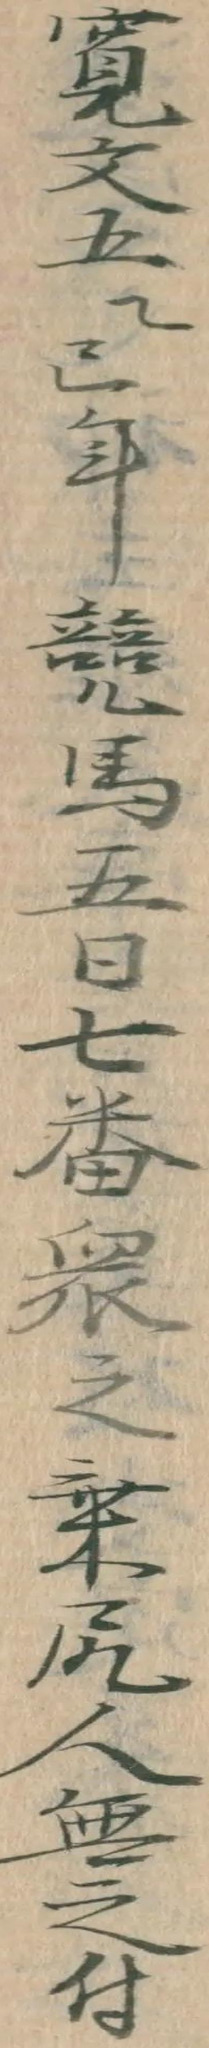寛文五乙巳年競馬五日七番衆之乗尻人無之付
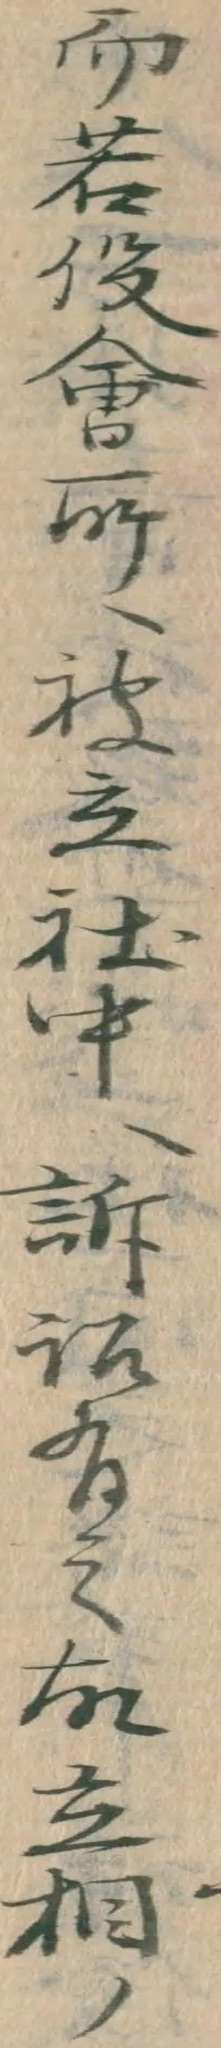而若役会所へ被立社中へ訴詔有之故立相ノ
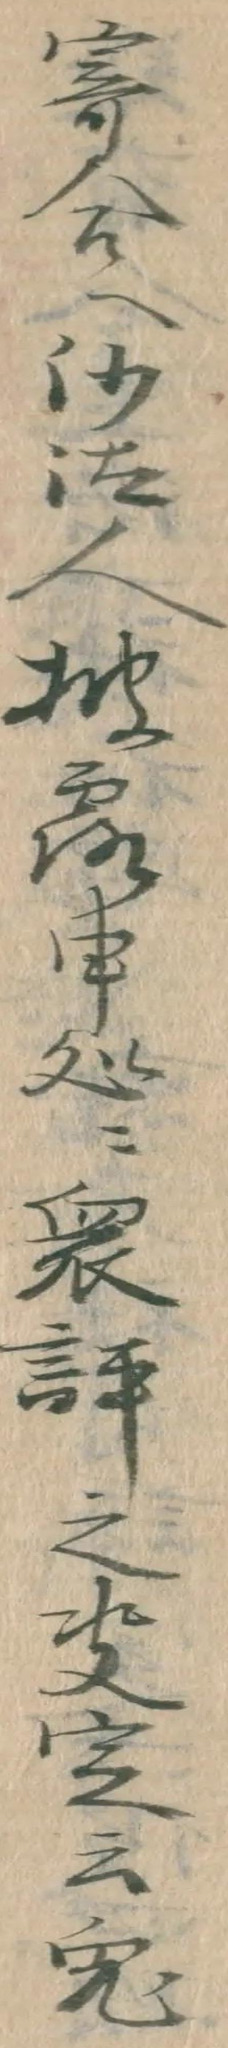寄合へ沙汰人披露申処ニ衆評之決定云兎
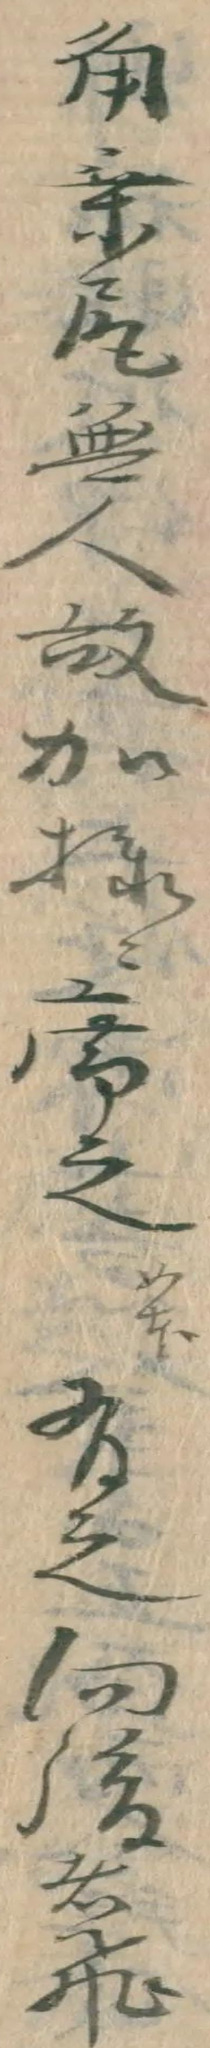角乗尻無人故加様ニ席之如末有之向後者飛
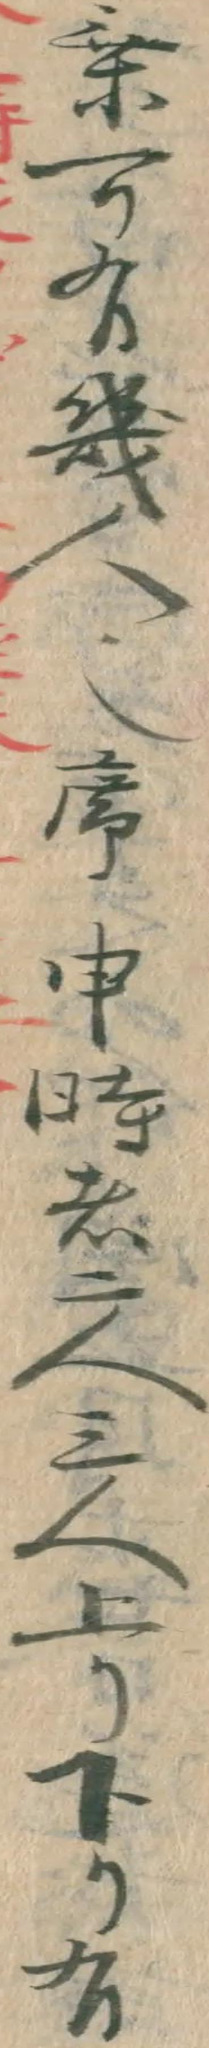乗可有幾人也席申時者二人三人上り下り有
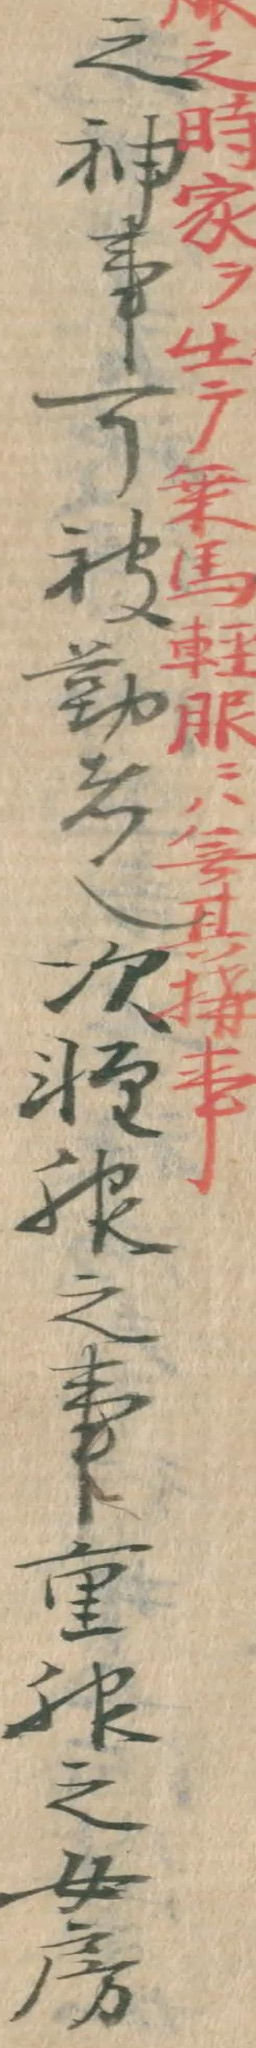之神事可被勤者也次軽服之事重服之女房
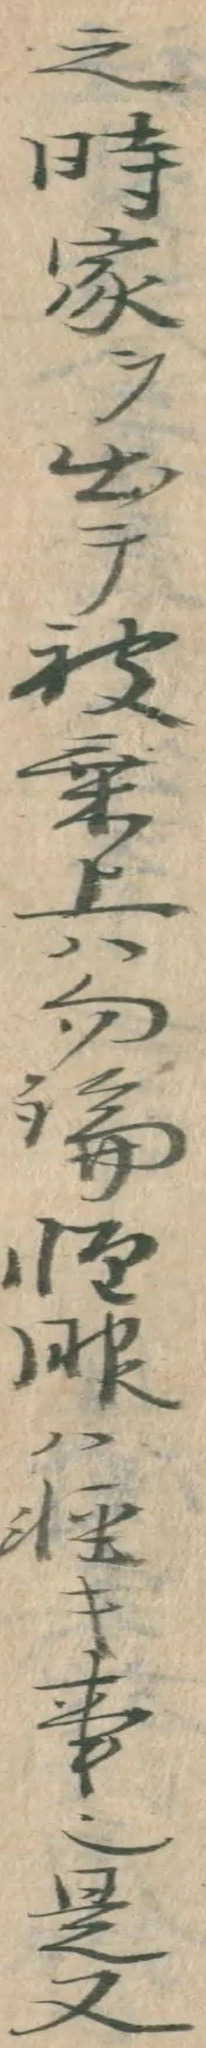之時家ヲ出テ被乗上ハ勿論軽服ハ軽キ事也是又
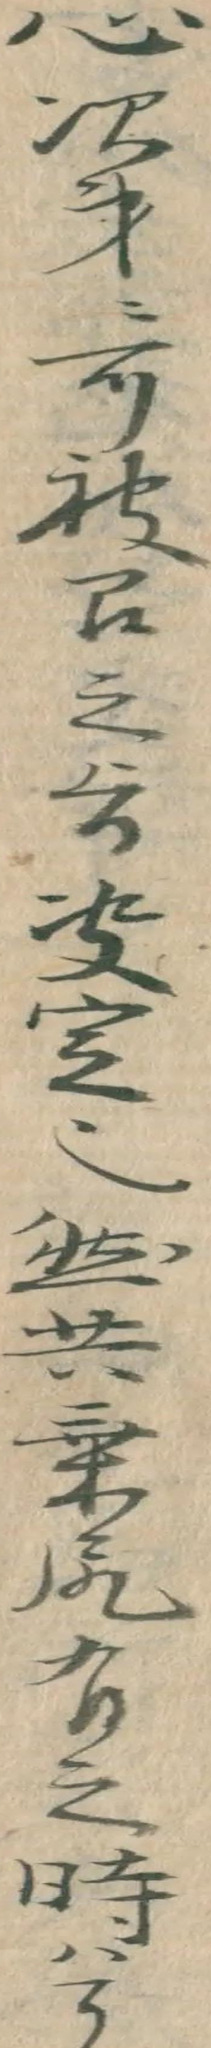心次第ニ可被召之旨決定也然共乗尻有之時ハ了
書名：賀茂社記録. 第10冊
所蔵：国立国会図書館 National Diet Library, JAPAN
